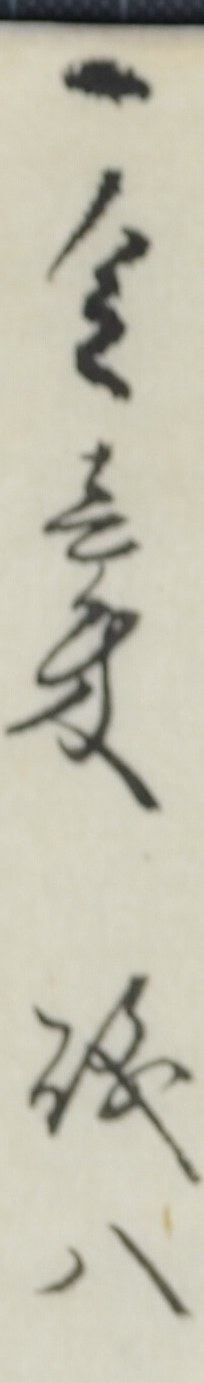一金壱朱銀八
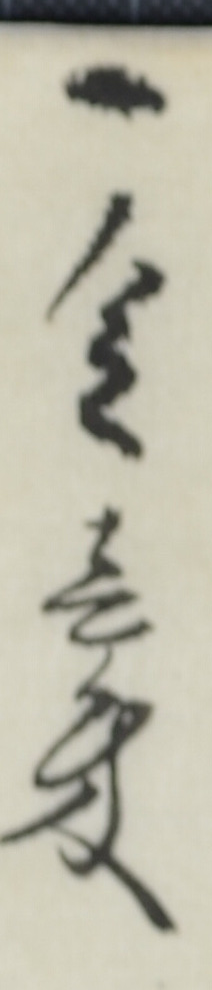一金壱朱銀八
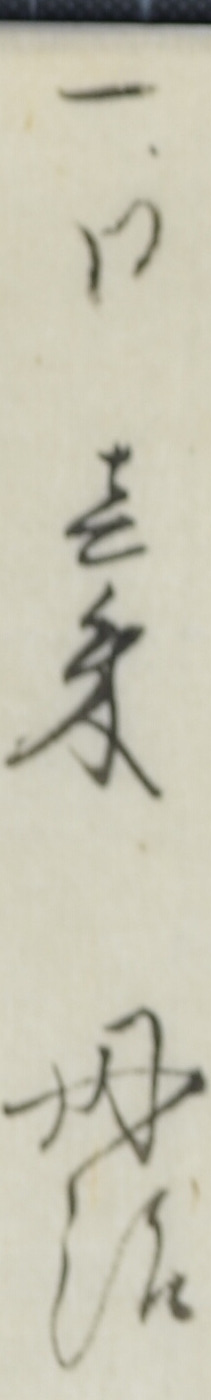一同壱朱丹治
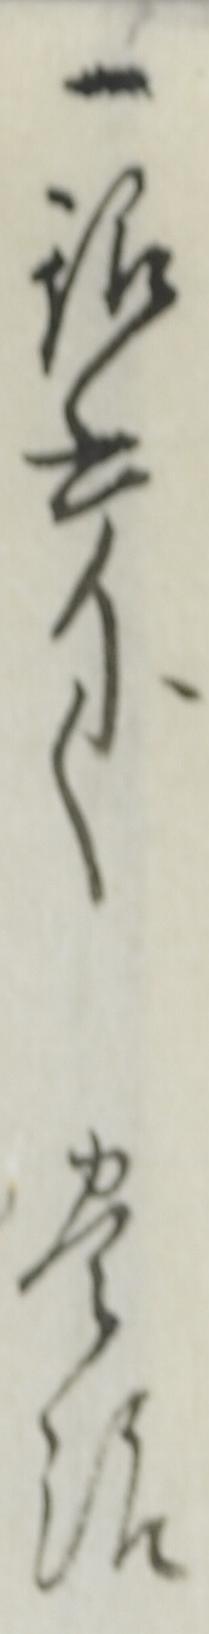一銀六匁豊治
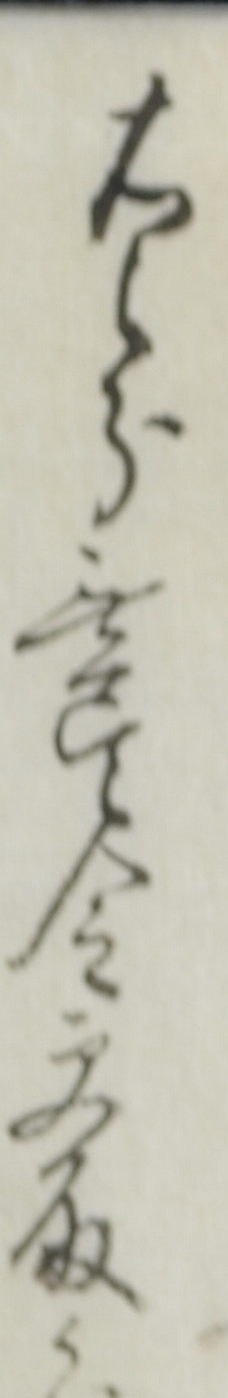右之分無尽金受取分
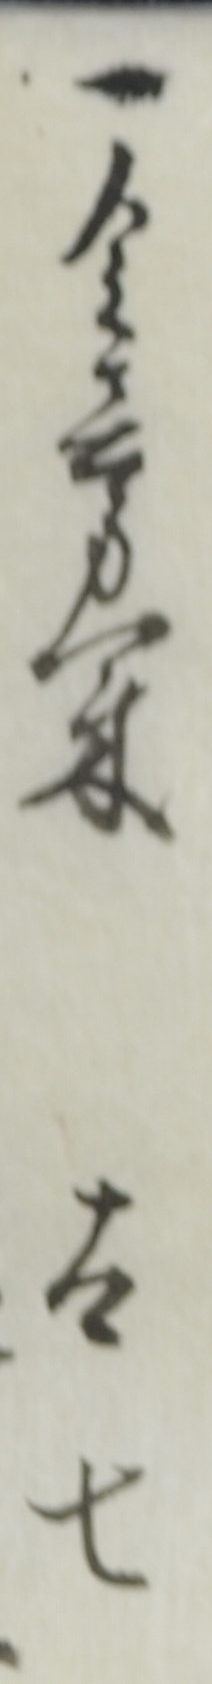一金壱朱銀八
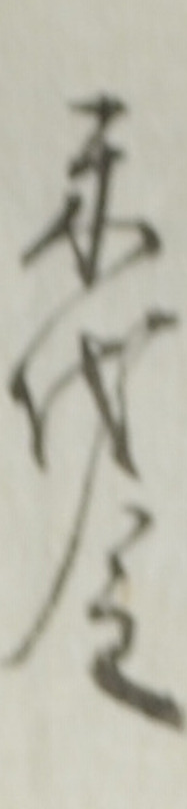米代金

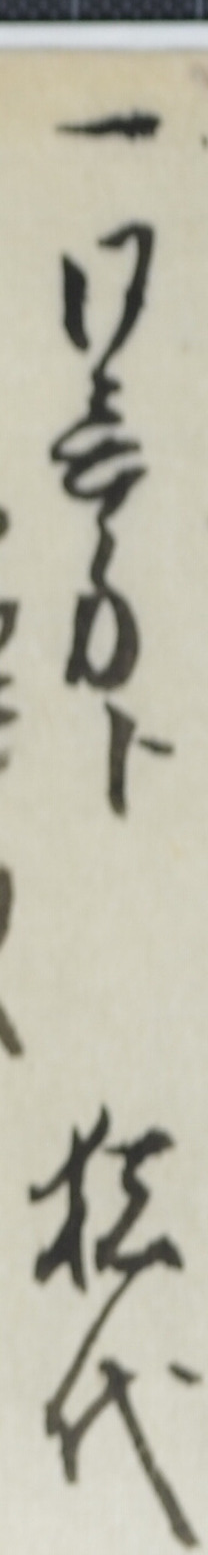一同壱分ト猪代
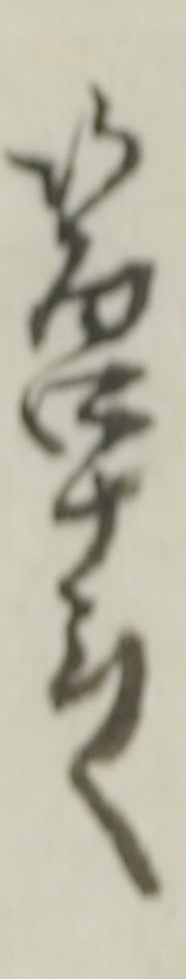弐百四十三文
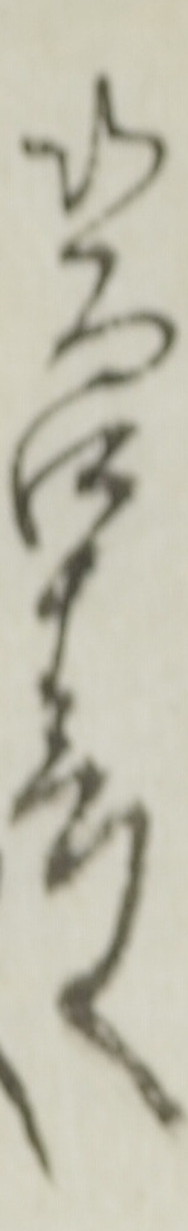弐百四十三文
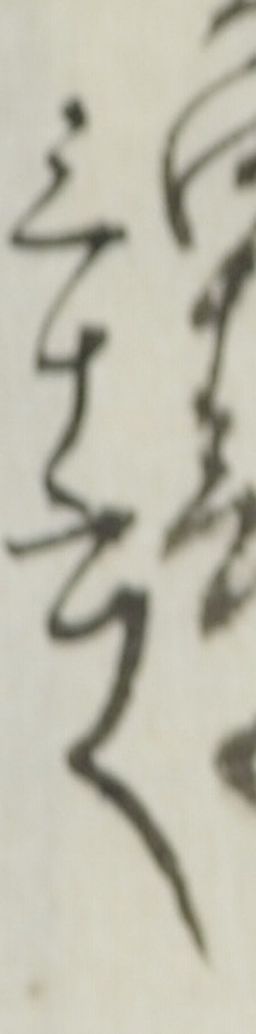三十六文
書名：（金銭勘定抜書）
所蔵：伊那市立高遠町図書館・合同会社AMANE
